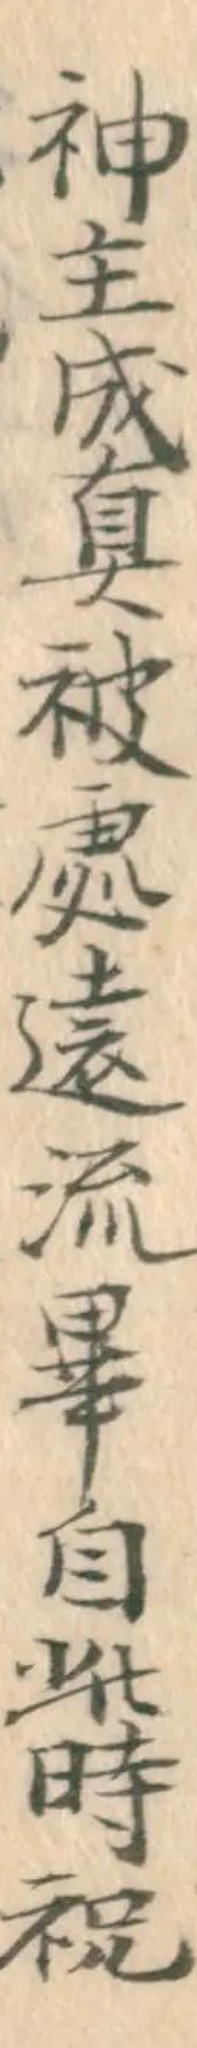神主成真被処遠流畢自此時祝
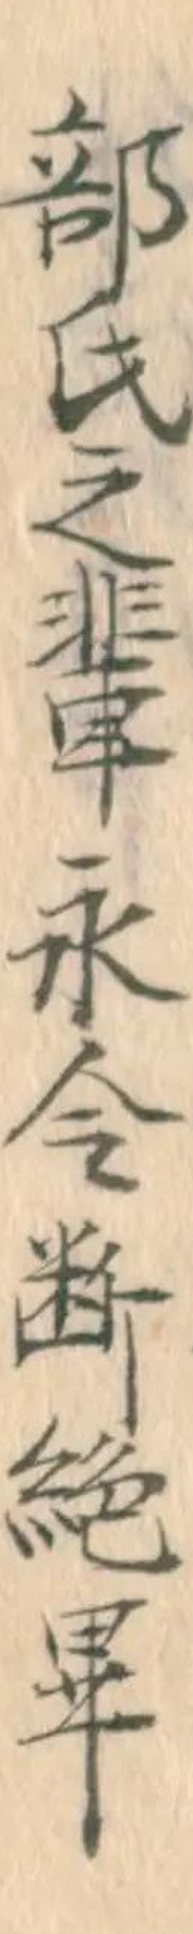部氏之輩永令断絶畢
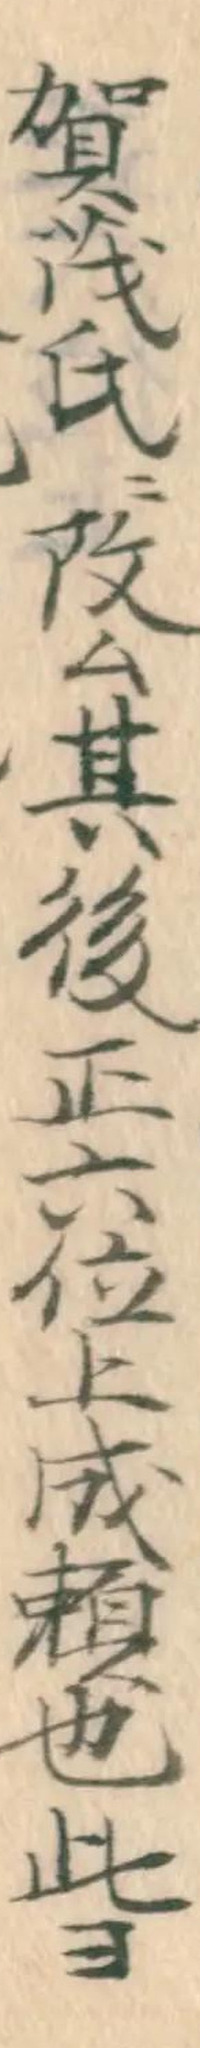賀茂氏ニ改ム其後正六位上成頼也此ヨ
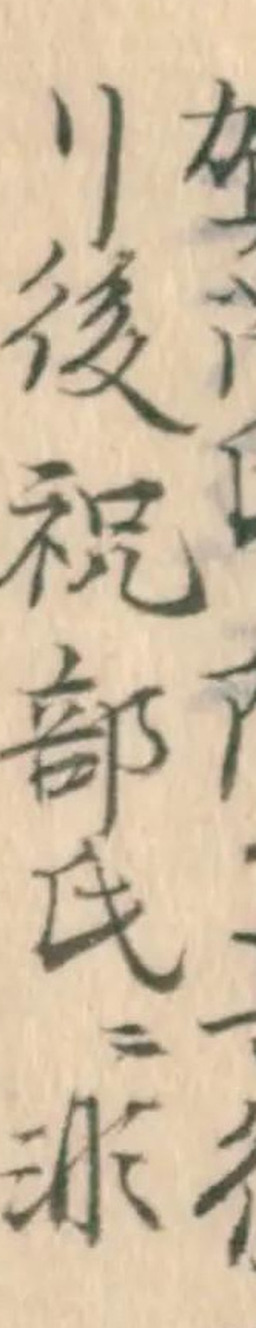リ後祝部氏ニ非
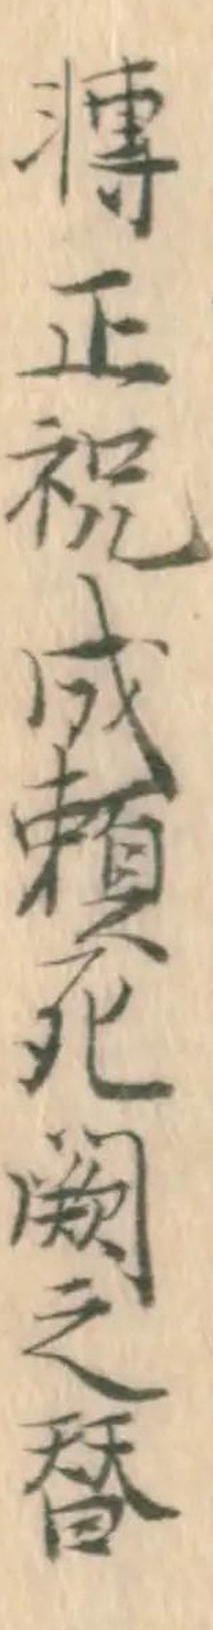転正祝成頼死闕之替
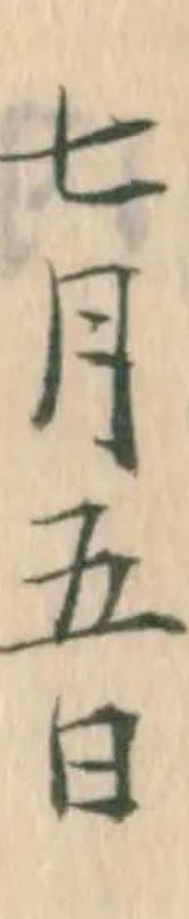七月五日
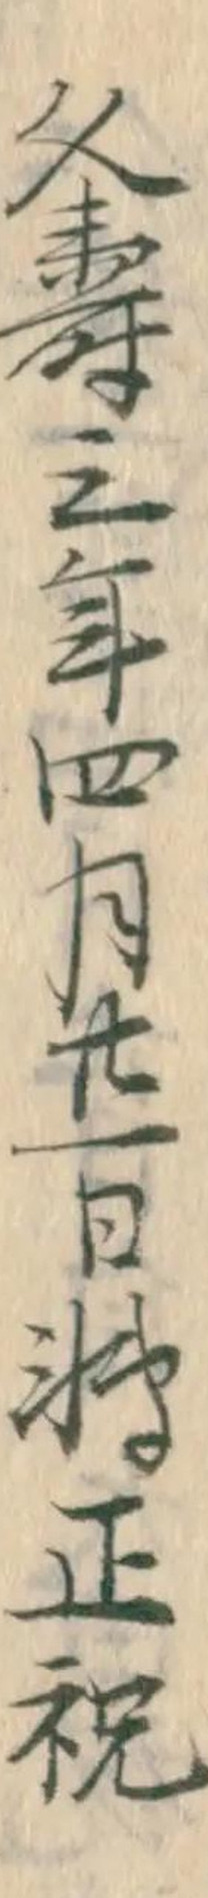久寿三年四月廿一日転正祝
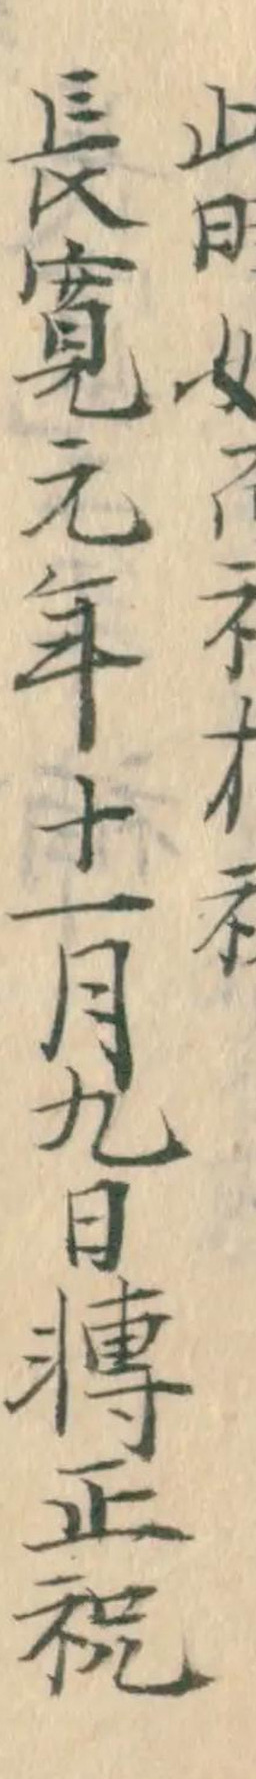月日長寛元年十一月九日転正祝

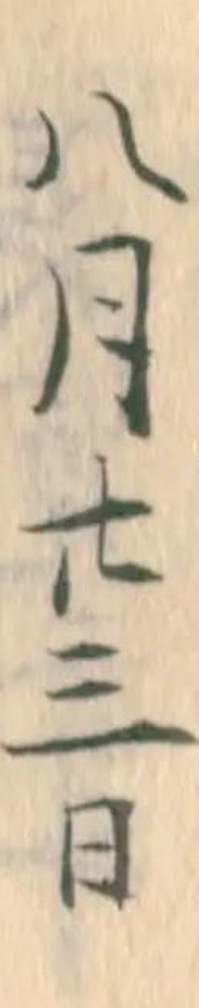八月廿三日
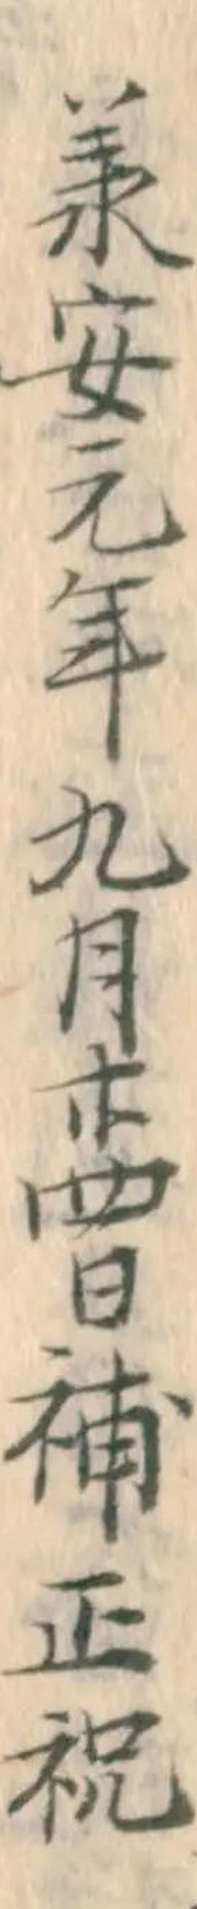承安元年九月廿四日補正祝
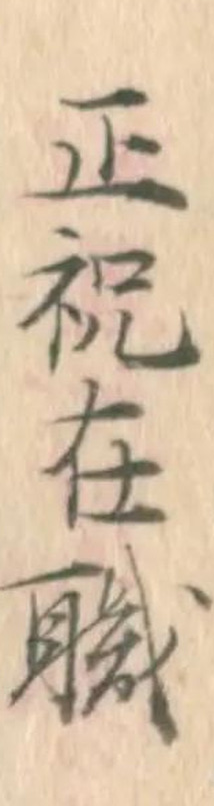正祝在職
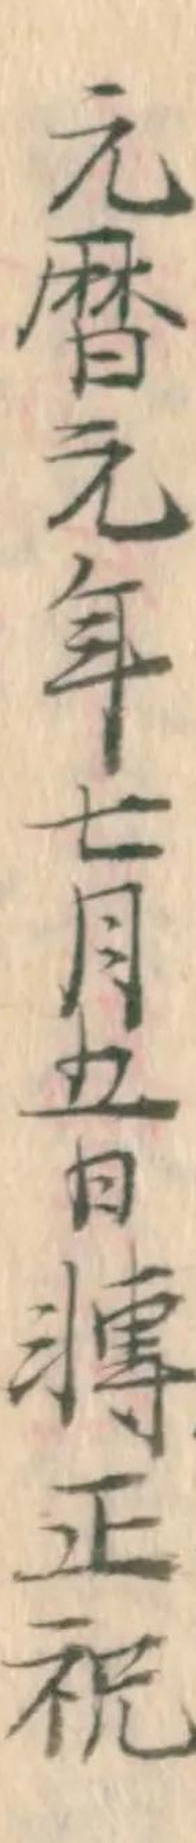元暦元年七月五日転正祝
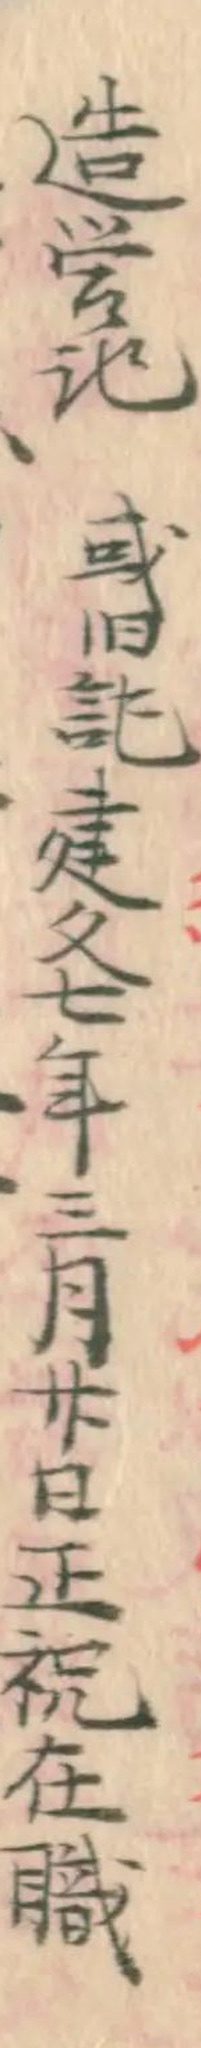造営記或旧記建久七年三月廿日正祝在職
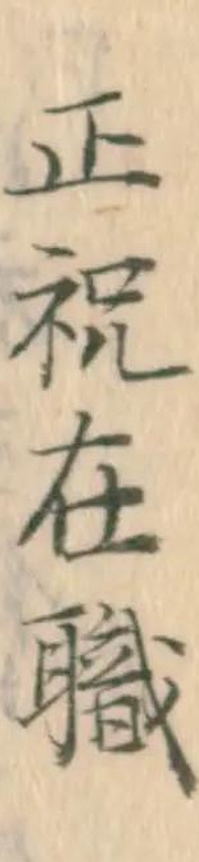正祝在職
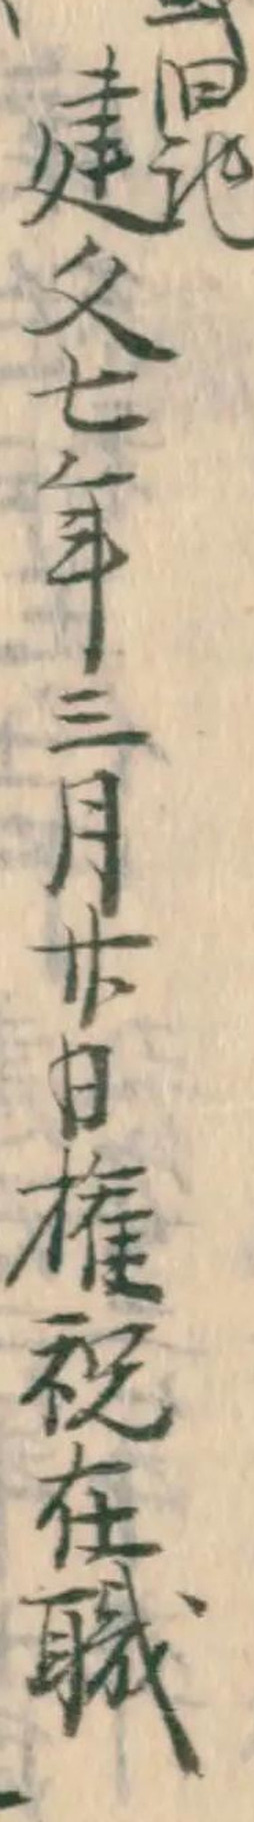建久七年三月廿日権祝在職
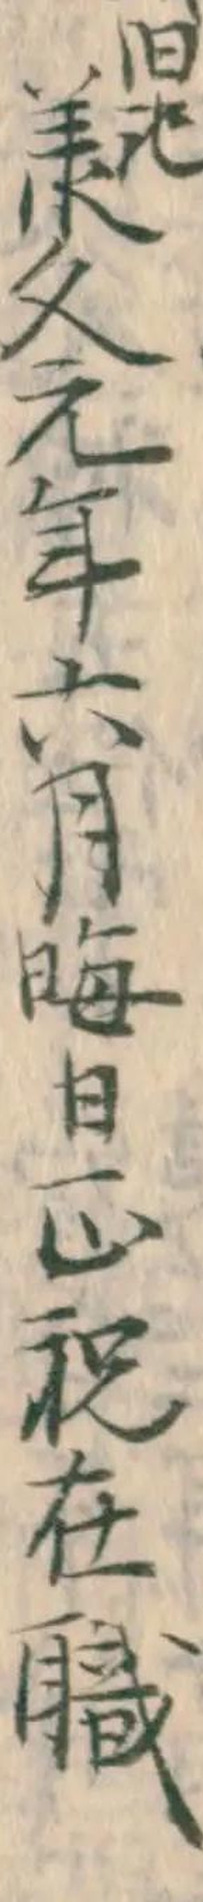承久元年六月晦日正祝在職
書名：賀茂社記録. 第23冊
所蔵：国立国会図書館 National Diet Library, JAPAN
